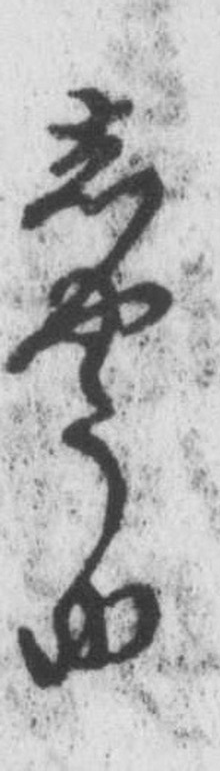しやうゆ
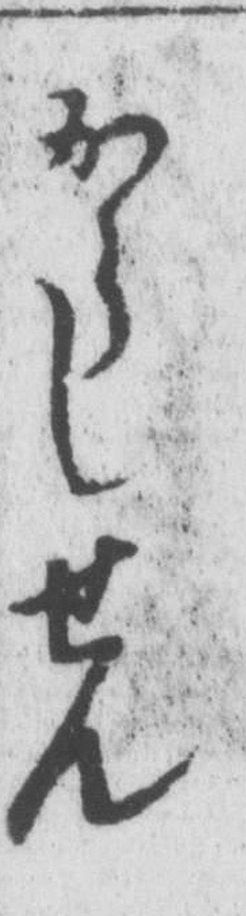からし煮切
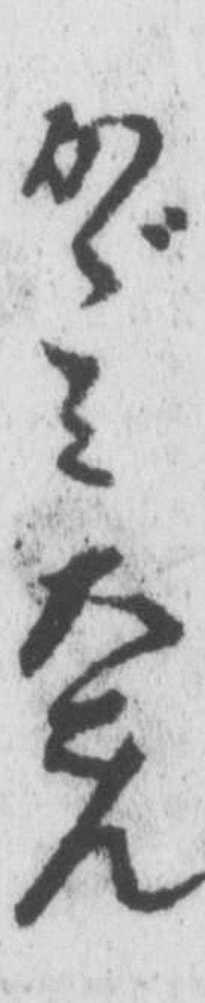かゞミ大こん
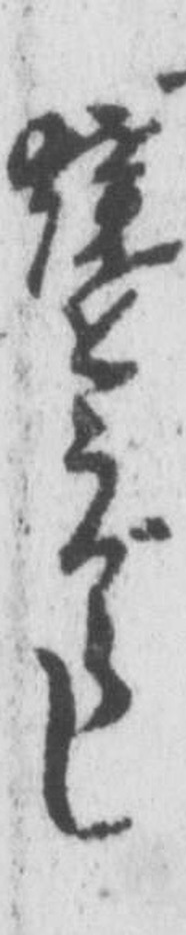焼とうがらし
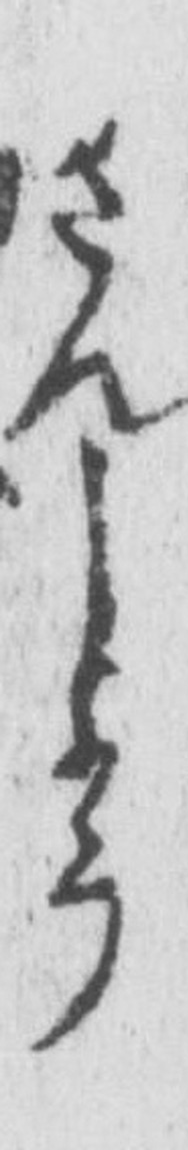さんしよう
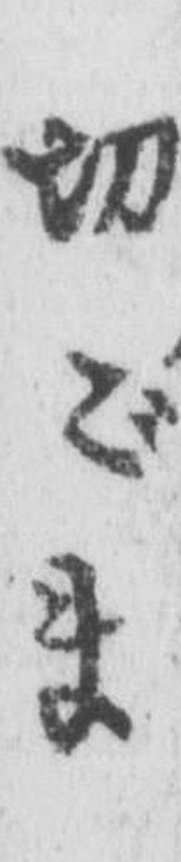切ごま
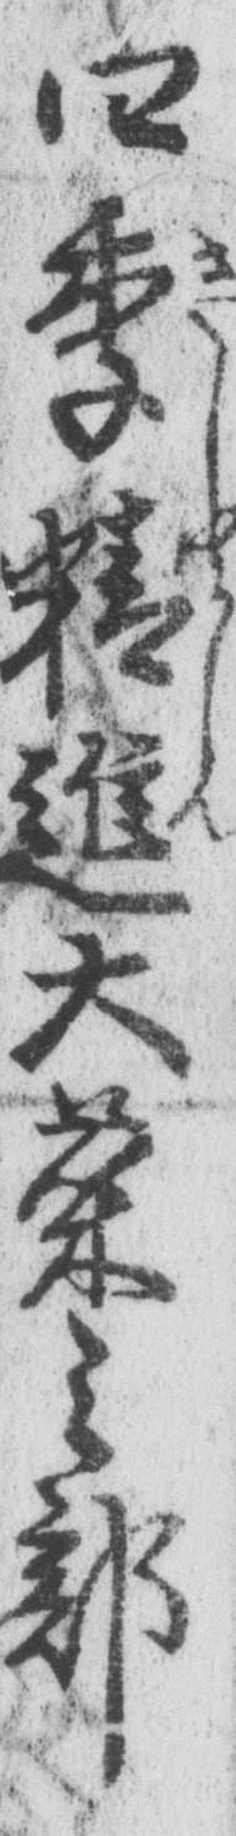四季精進大菜之部
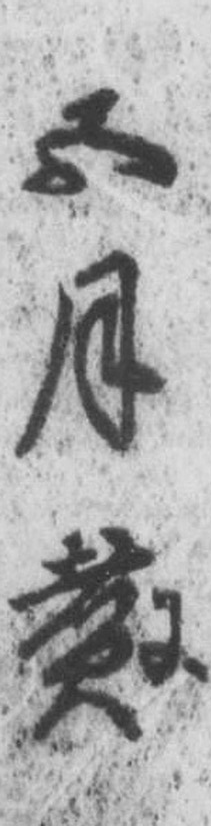五月煮

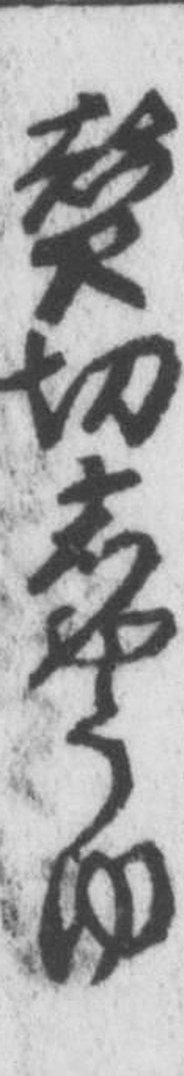切しやうろ
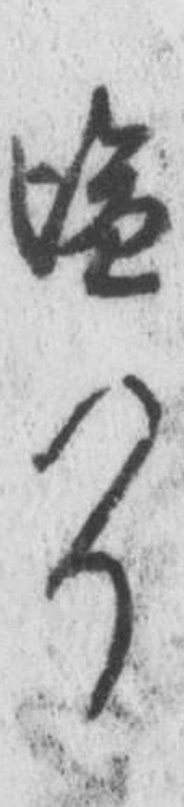塩いり
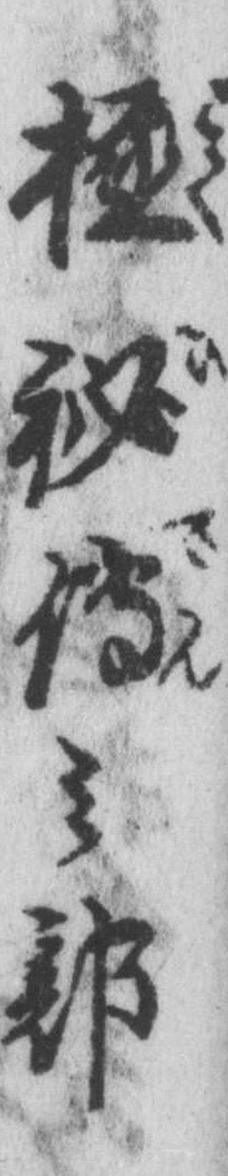極秘傳之部
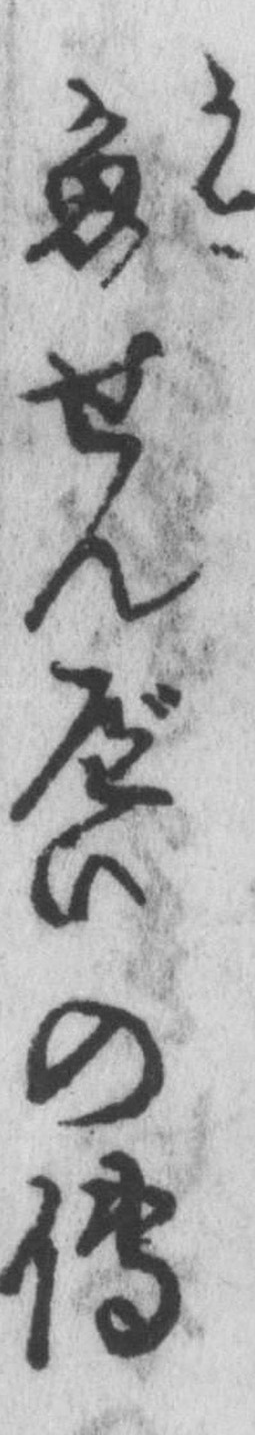魚せんべいの傳
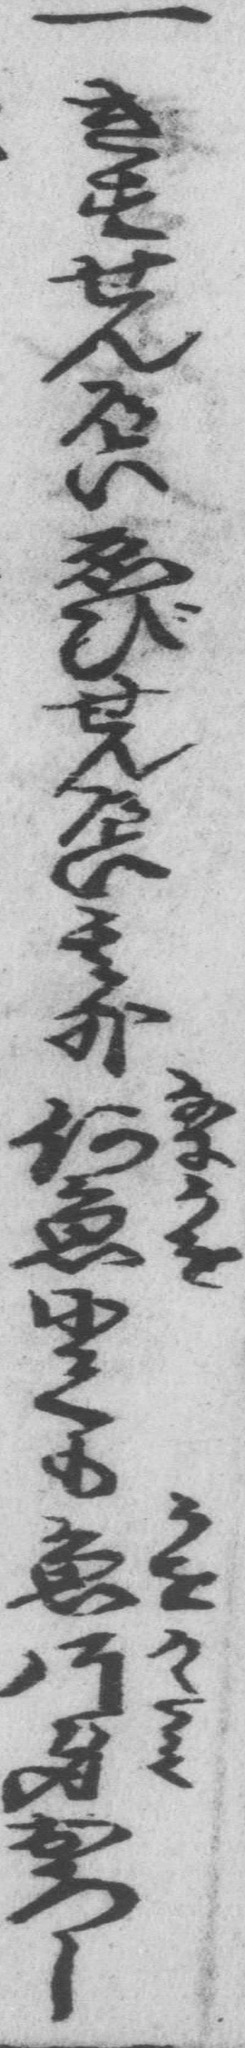一きすせんへいゑびせんへいの其外何魚にても魚片身おろし
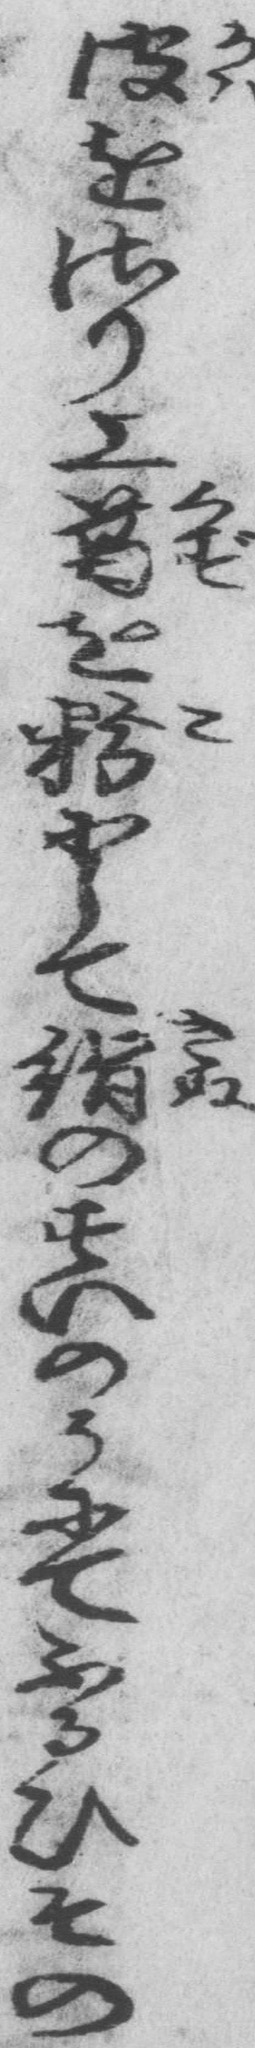皮をさり上葛を粉にして絹のすいのうにてふるひその
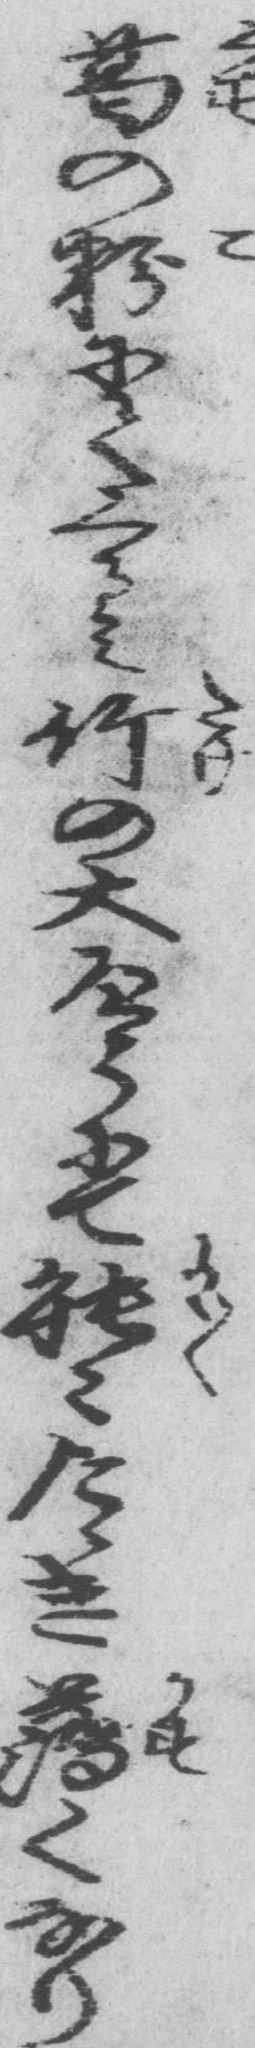葛の粉にてくるミ竹の大へらにて能々たゝき薄くなり
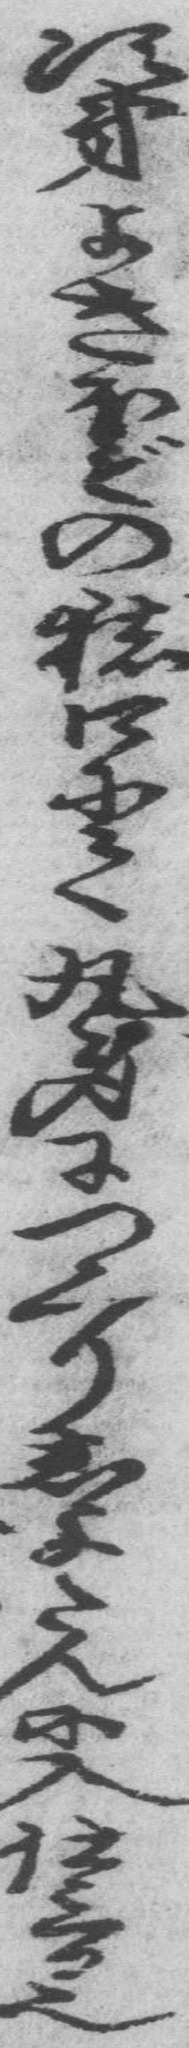次第よきほどの猪口にて丸身につくりしよたんに入仕立てる
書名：当世料理献立
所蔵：大阪府立大学学術情報センター 国文学研究資料館
